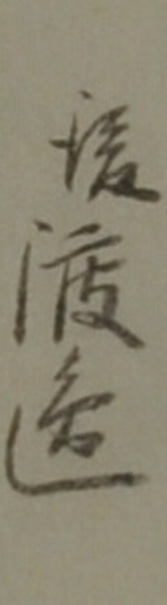後渡邊
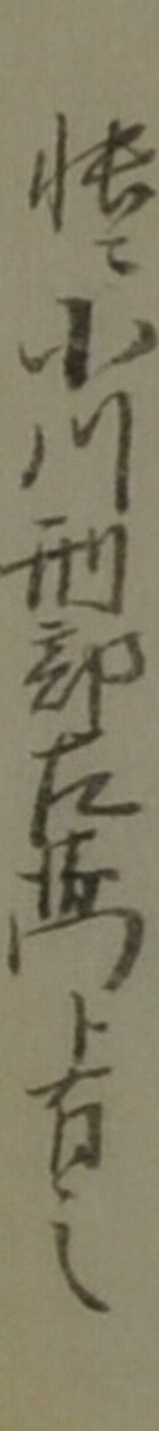帳ニ小川刑部左衛門ト有之
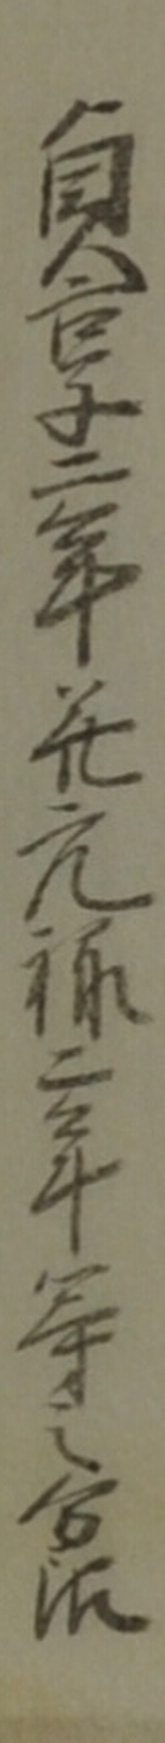貞享二年幷元禄二年等之分限
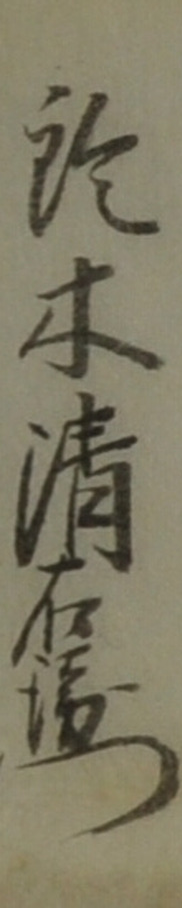鈴木清右衛門
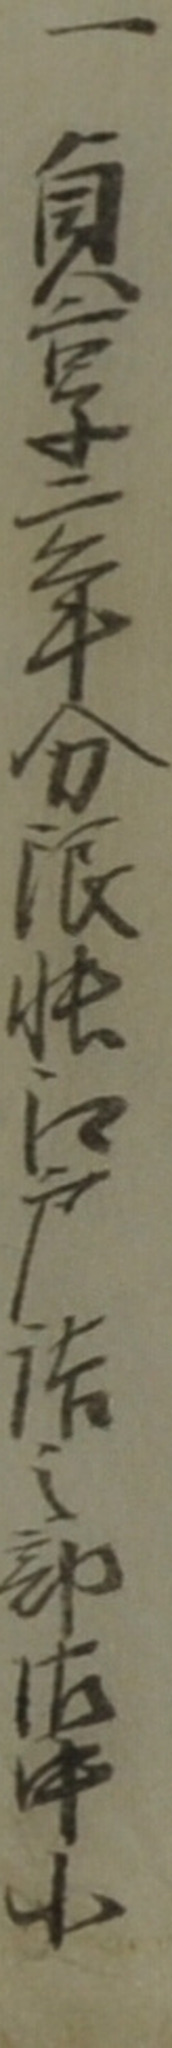一貞享二年分限帳江戸詰之部御中小
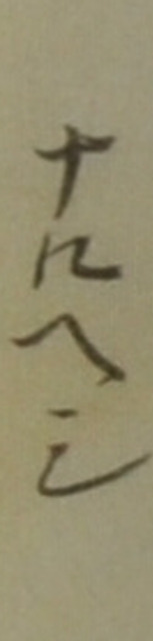ナルヘシ
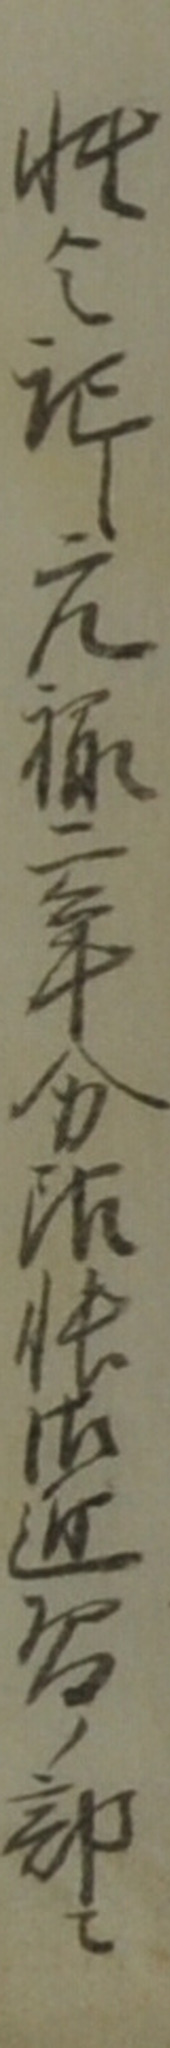性与記し元禄二年分限帳御近習ノ部ニ
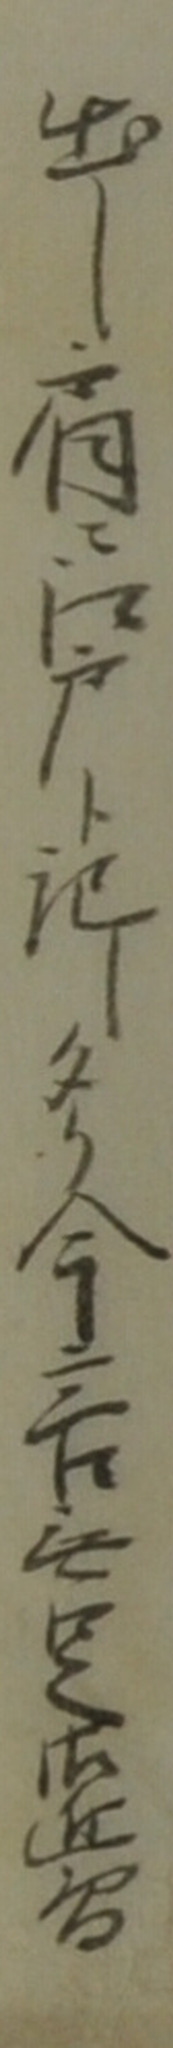出し肩ニ江戸ト記しタリ無足御近習

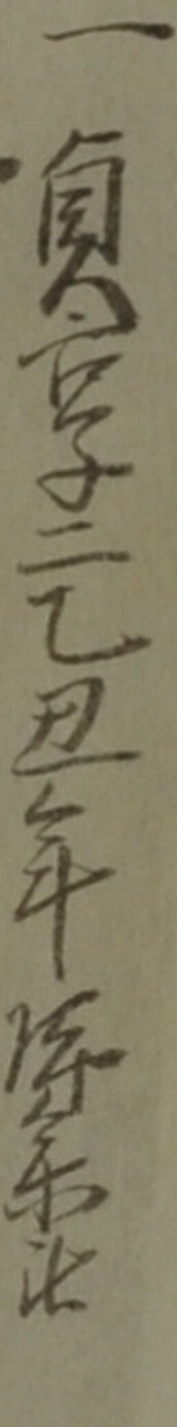一貞享二乙丑年帰参被
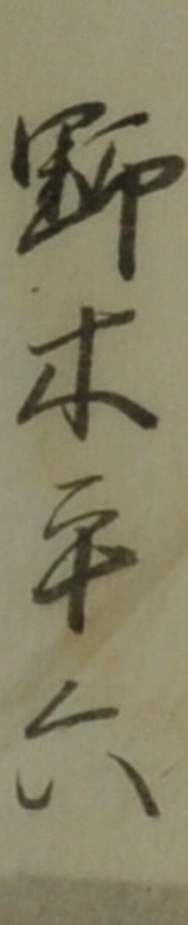野木平六
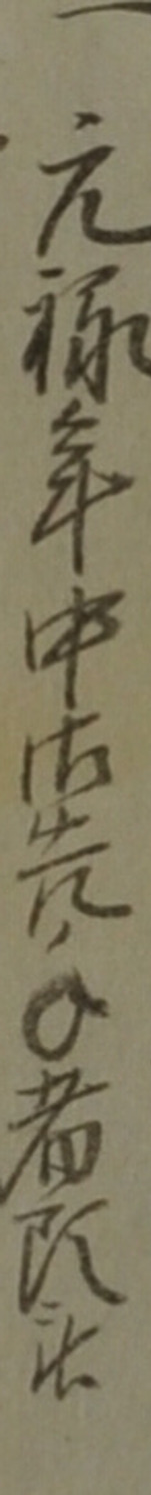一元禄年中御先手者頭被
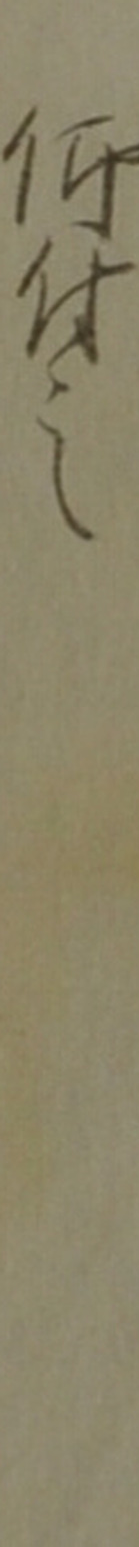仰付之
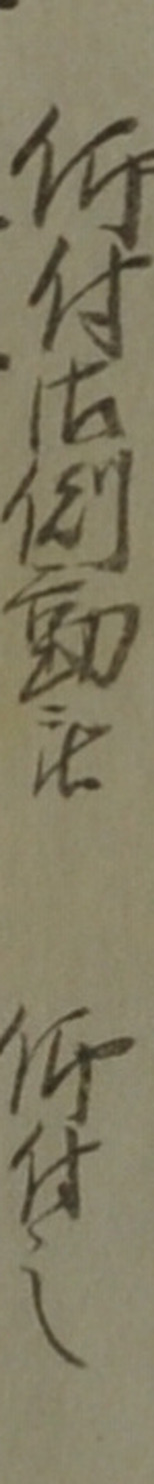仰付御側勤被仰付之
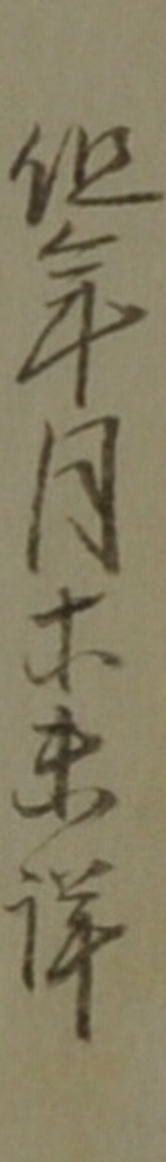但年月等未詳
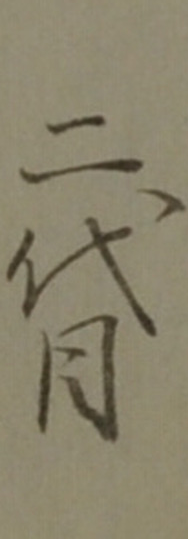二代目
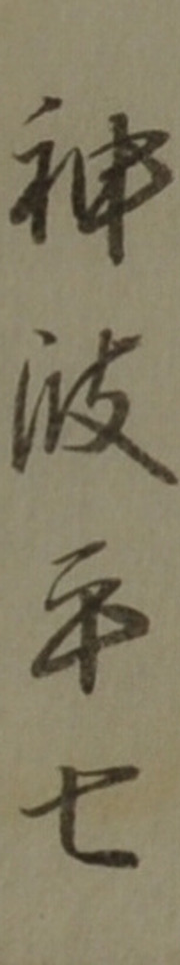神波平七
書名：諸御役代々録（五）
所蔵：伊那市立高遠町図書館・合同会社AMANE
